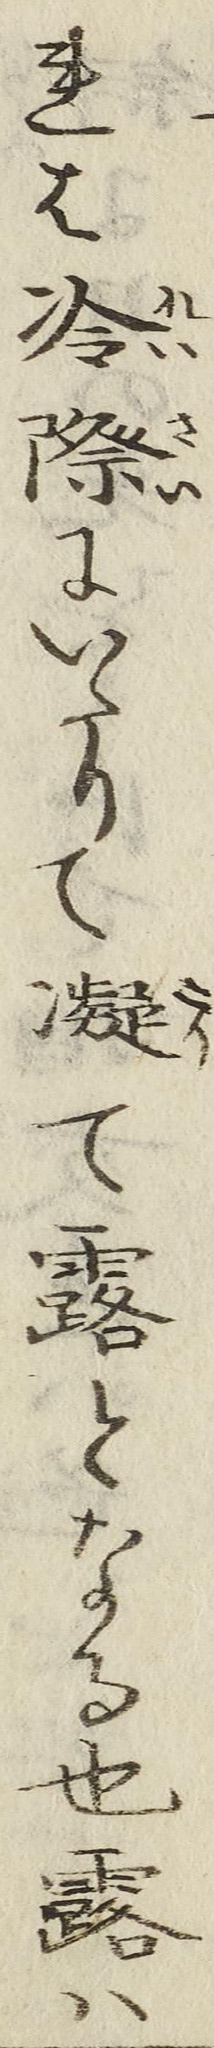れは冷際にいたりて凝て露となる也露は
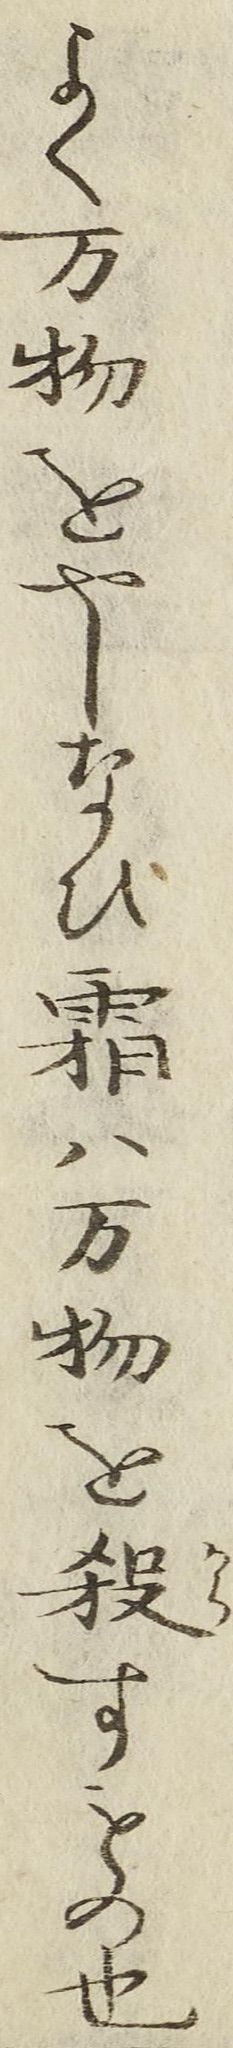よく万物をやしなひ霜は万物を殺すもの也
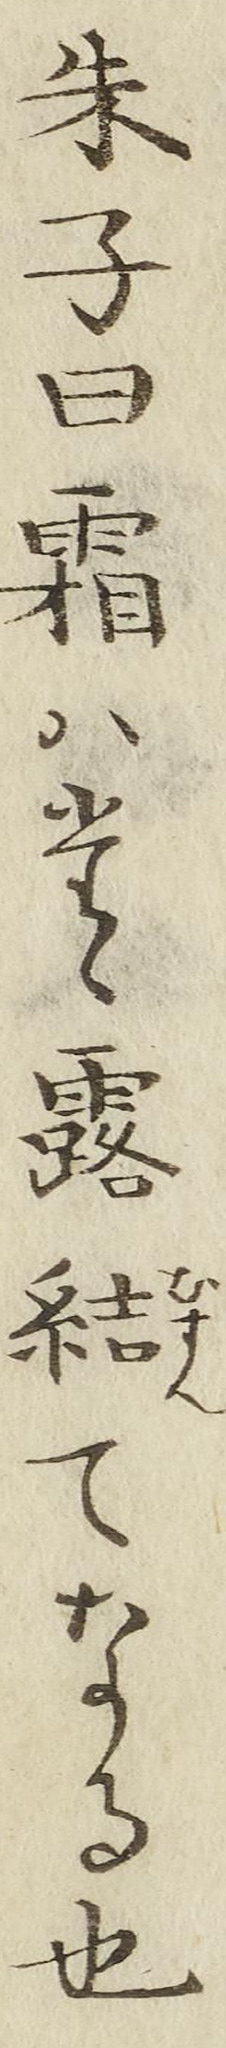朱子曰霜はたゝ露結てなる也

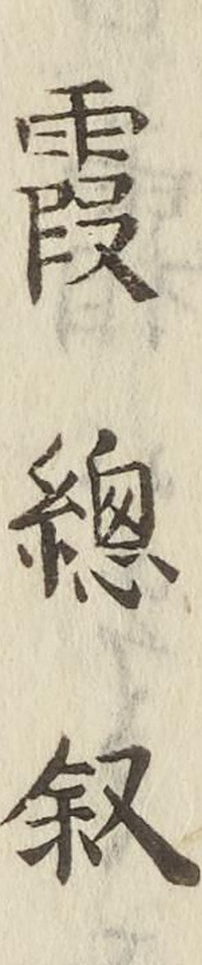霞総叙
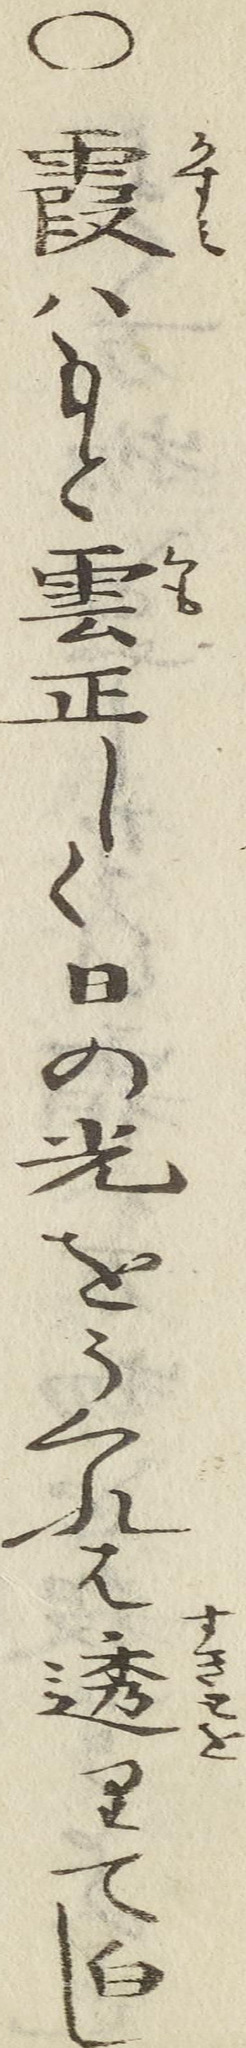○霞はもと雲正しく日の光をうくれは透りて白し
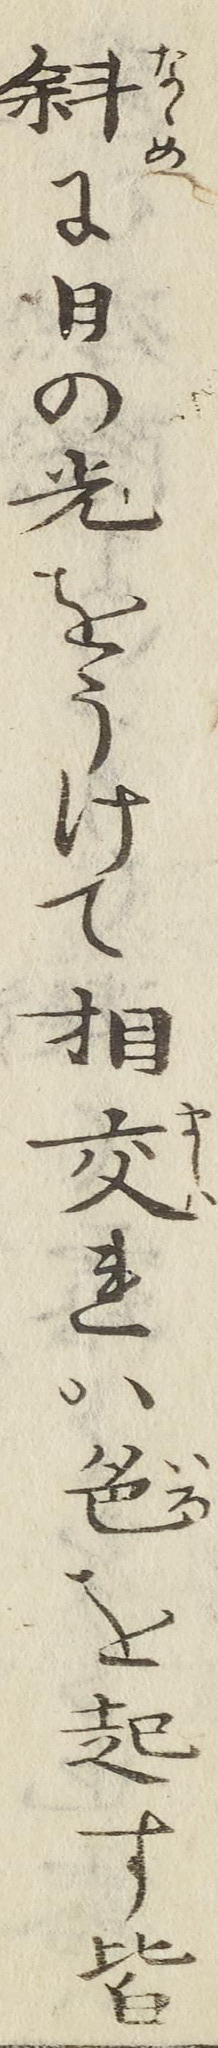斜に日の光をうけて相交れは色を起す皆
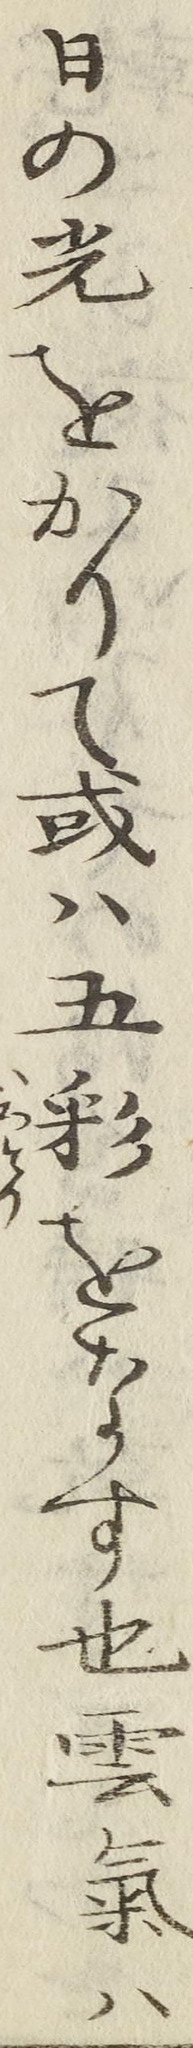日の光をかりて或は五彩をなす也雲気は
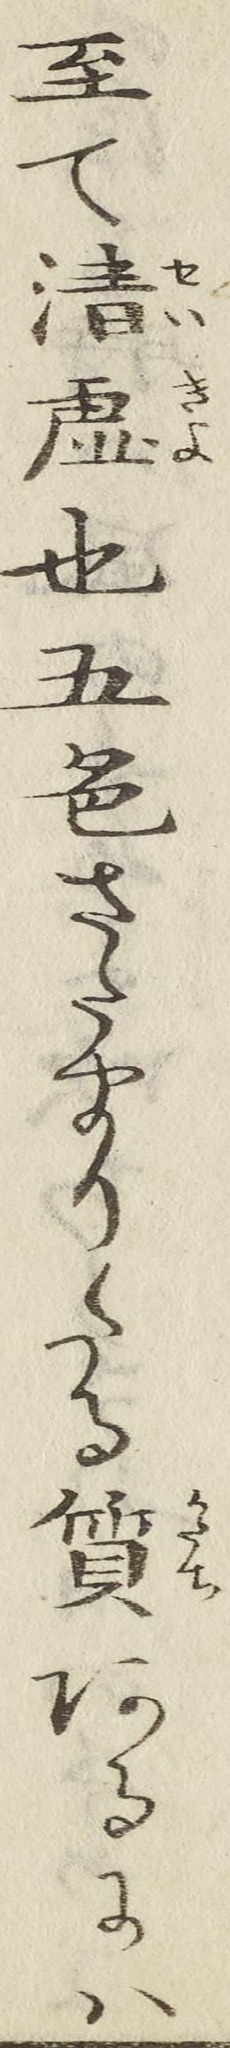至て清虚也五色さたまりたる質あるには
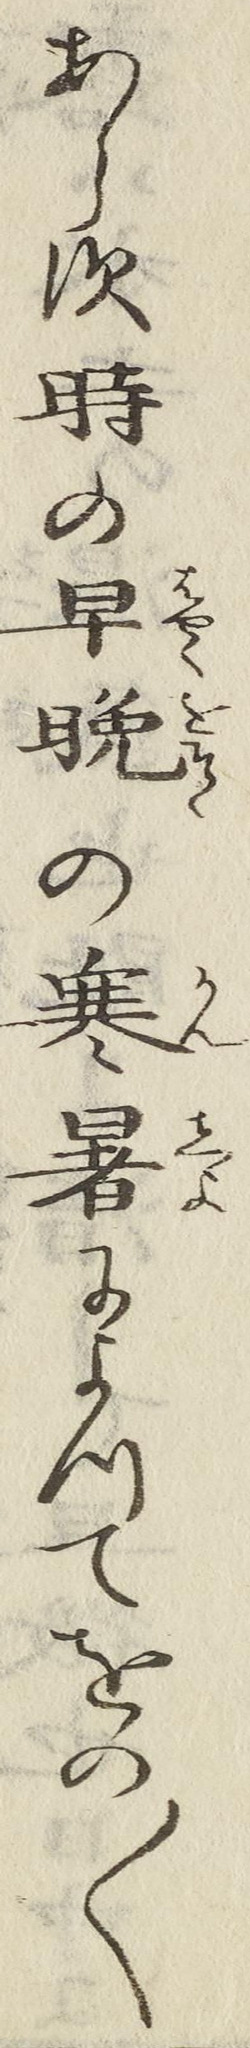あらす時の早晩の寒暑によつてをの〳〵
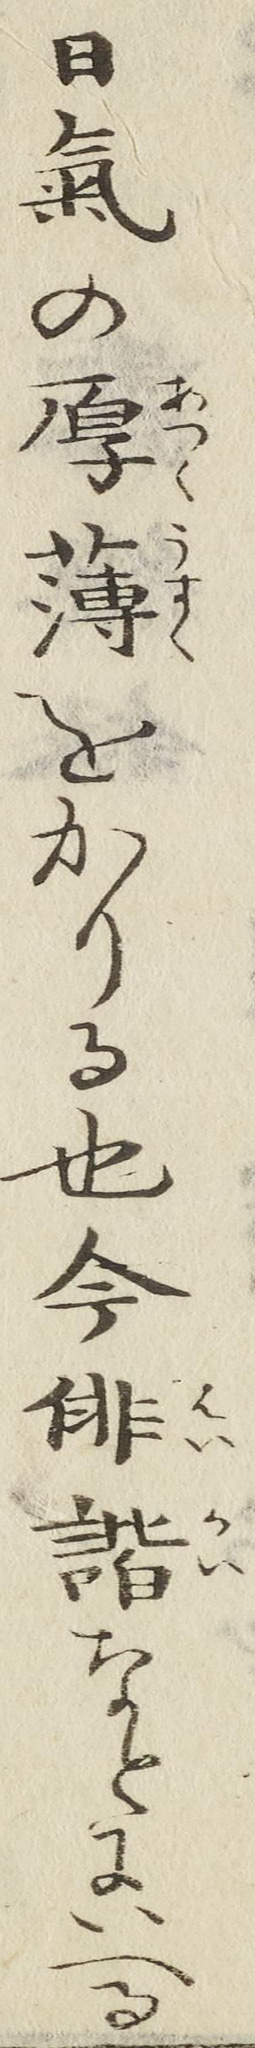日気の厚薄をかりる也今俳諧なとにいへる
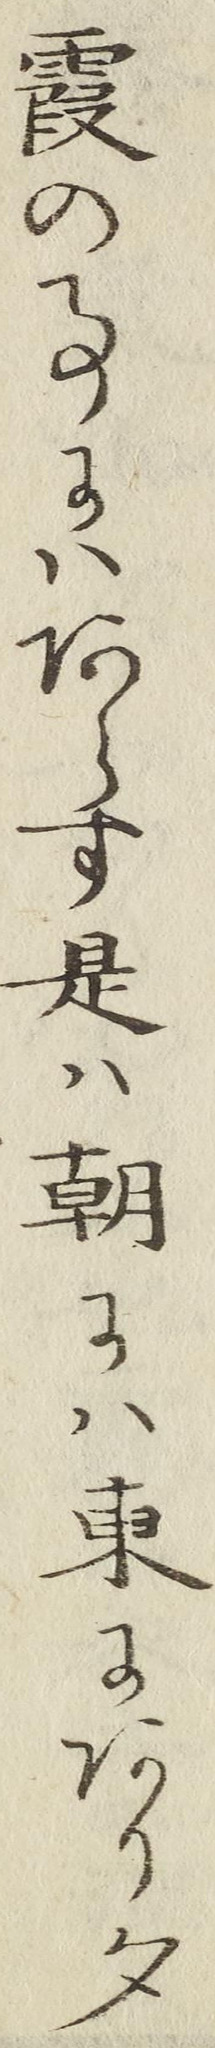霞の事にはあらす是は朝には東にあり夕
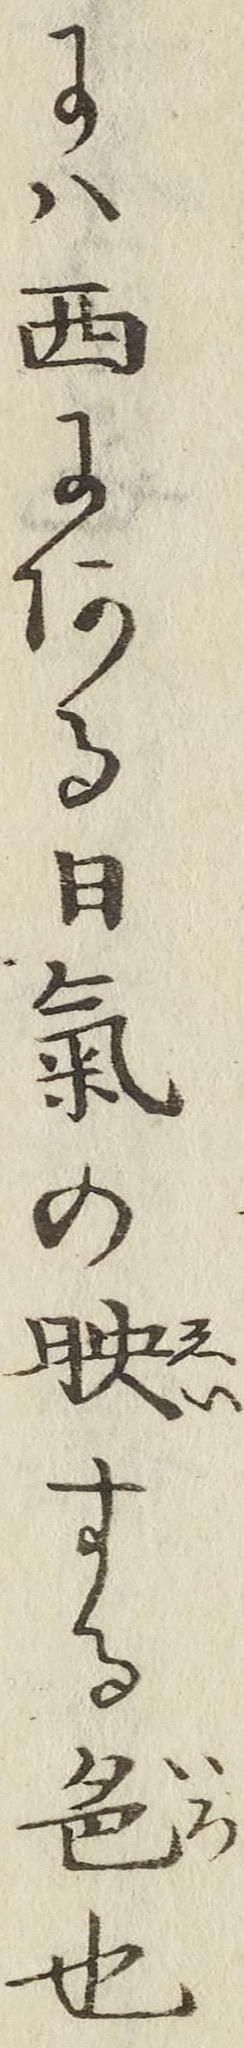には西にある日気の映する色也
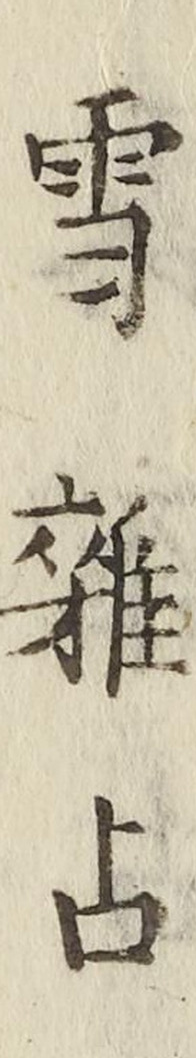雪雑占
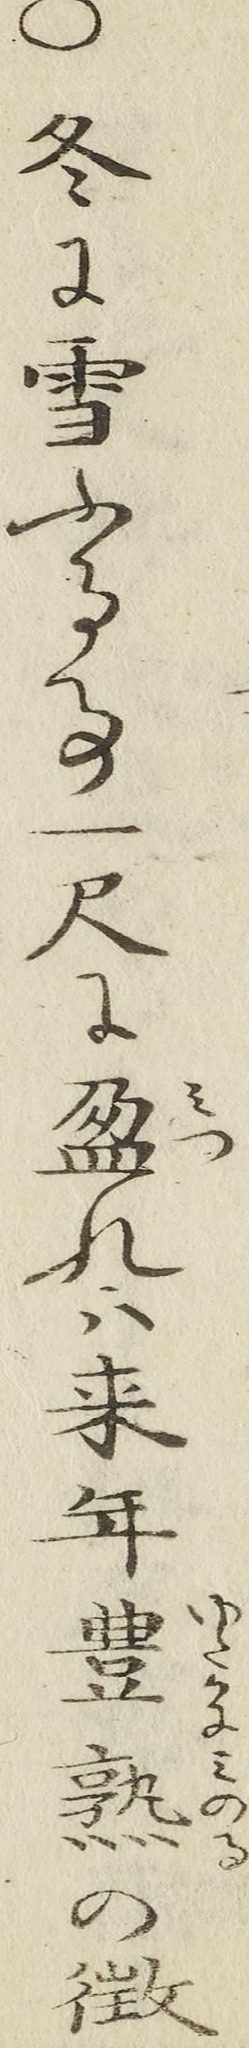○冬に雪ふる事一尺に盈れは来年豊熟の徴
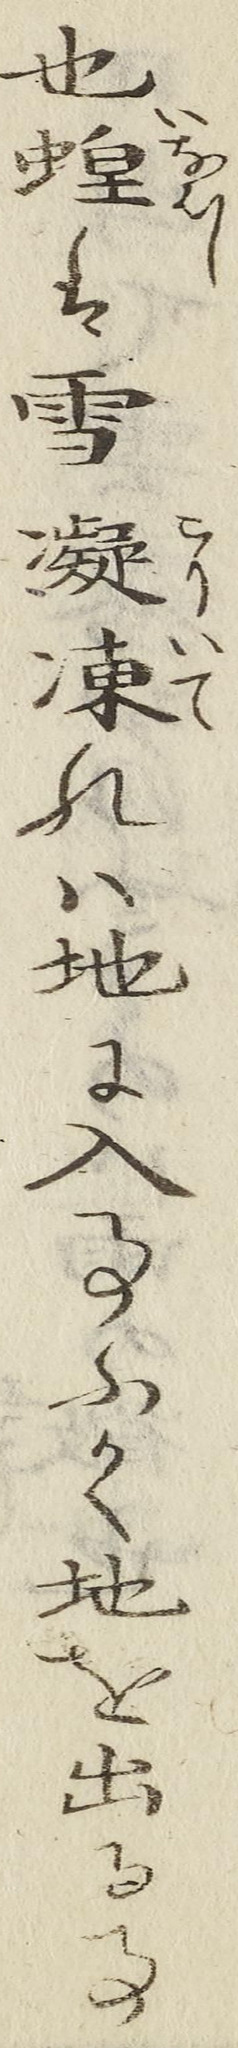也蝗は雪凝凍れは地に入事ふかく地を出る事
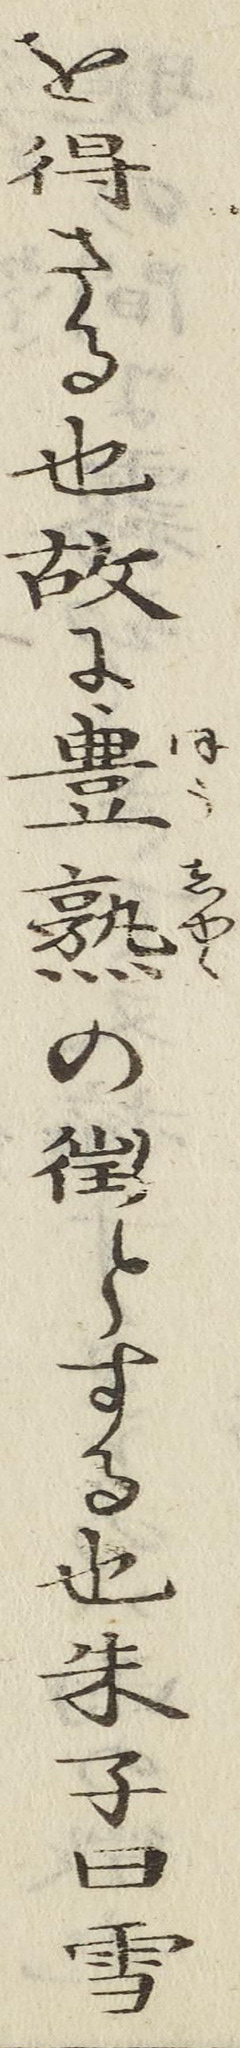を得さる也故に豊熟の徴とする也朱子曰雪
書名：天時占候　二
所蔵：東京大学地震研究所図書室 Earthquake Research Institute Library, The University of Tokyo, JAPAN
